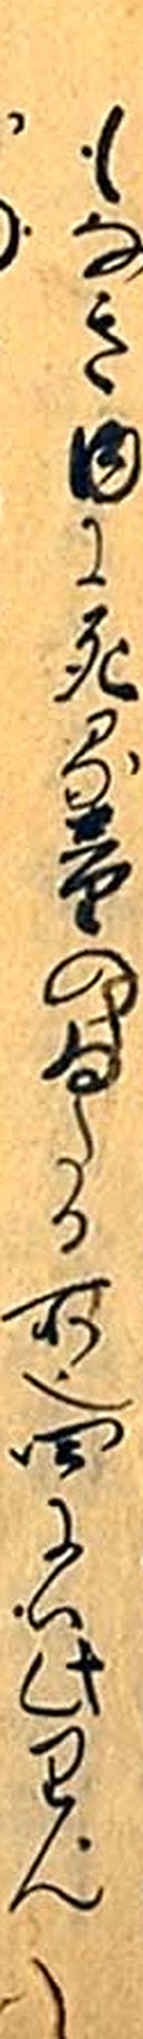もなき内に死る童のゐたる所也四には此りん
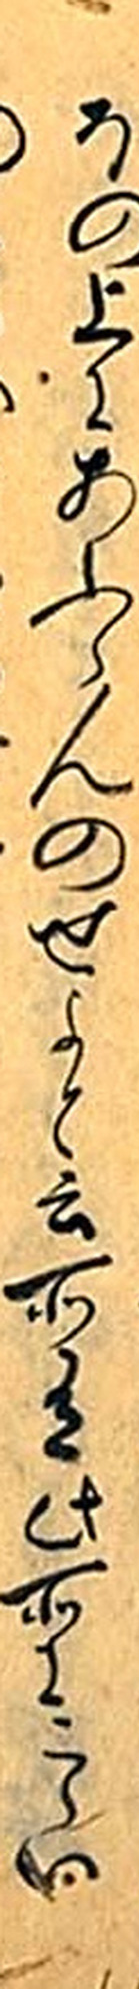ほの上にあふらんのせよと云所有此所にこらい
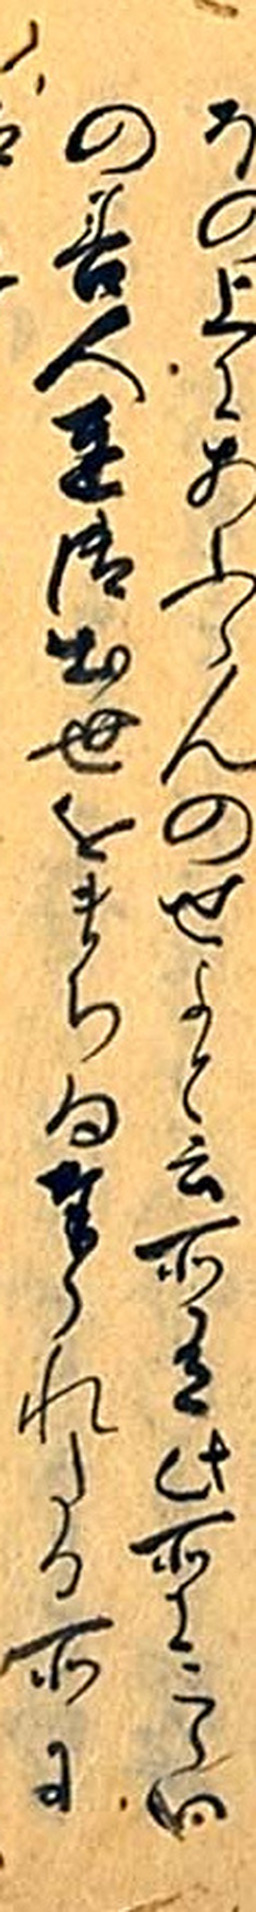の善人達御出世をまちゐ奉られたる所に
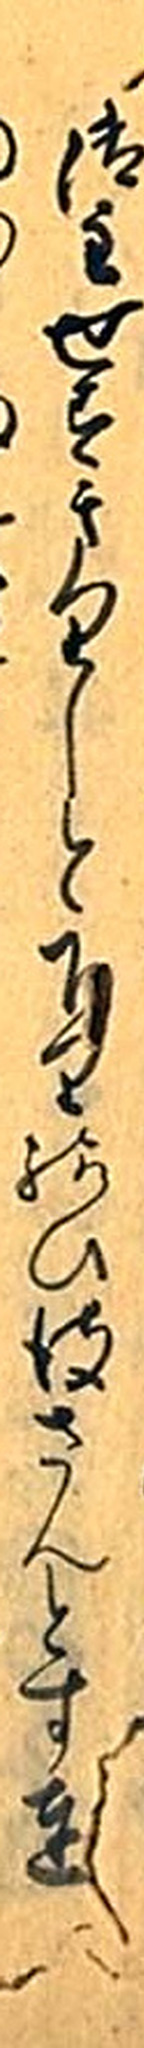御主せすきりしと下り給ひ彼さんとす達
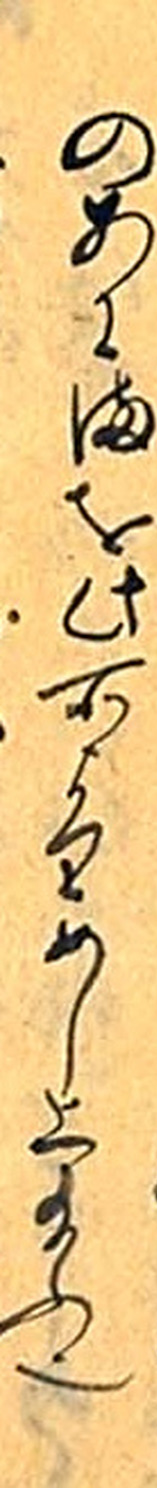のあにまを此所よりめし上給ふ也
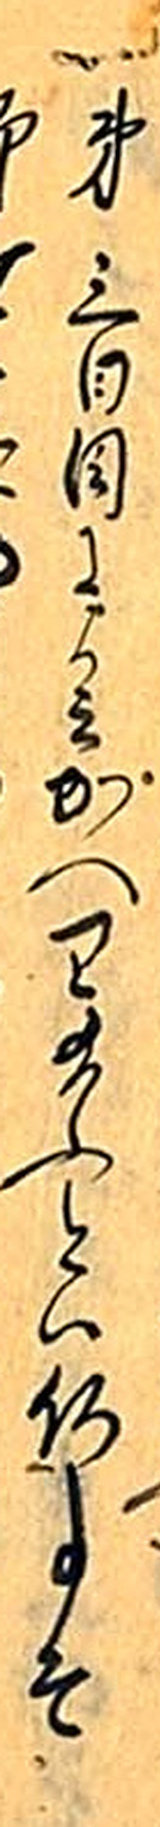弟三日目によみかへり給ふとは何事そ
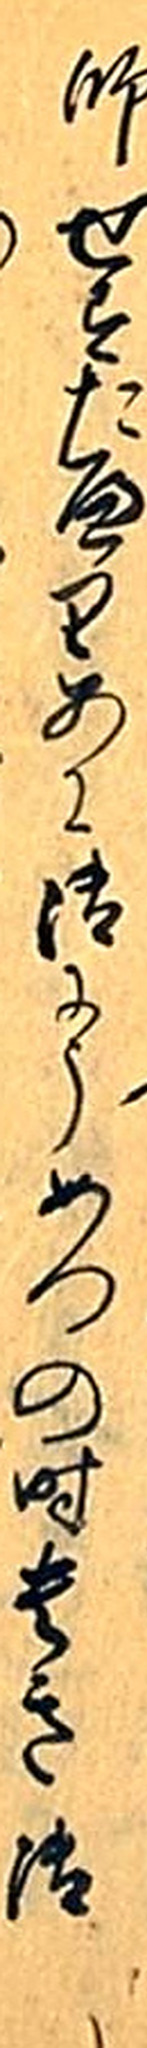師せすたへりあに御にうめつの時貴き御
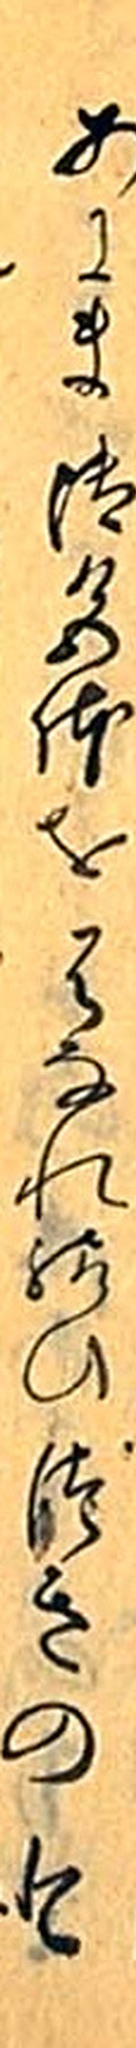あにま御色体をはなれ給ひつきのと
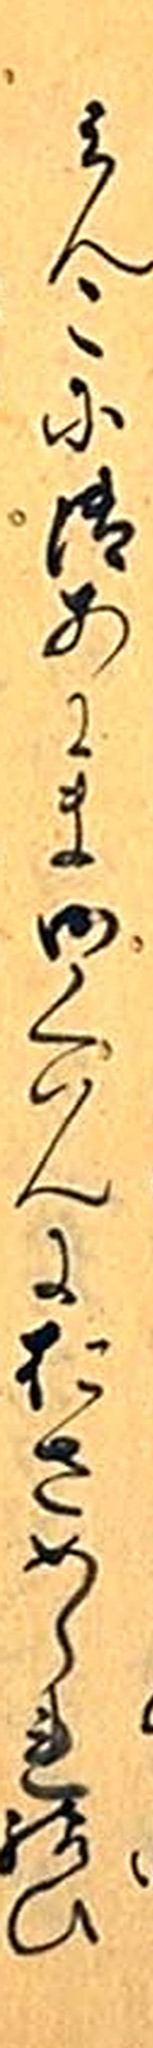みんこに御あにま御くはんにおさめられ給ひ
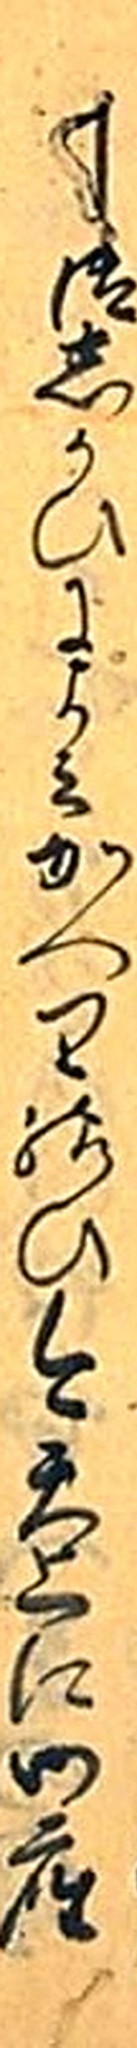し御しかひによみかみかへり給ひ今天上に御座
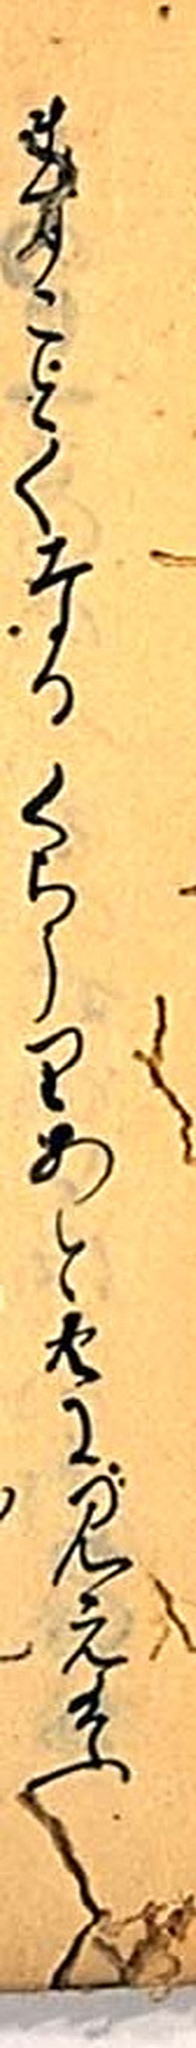ますことくなるくらうりあと共に見え給ふ
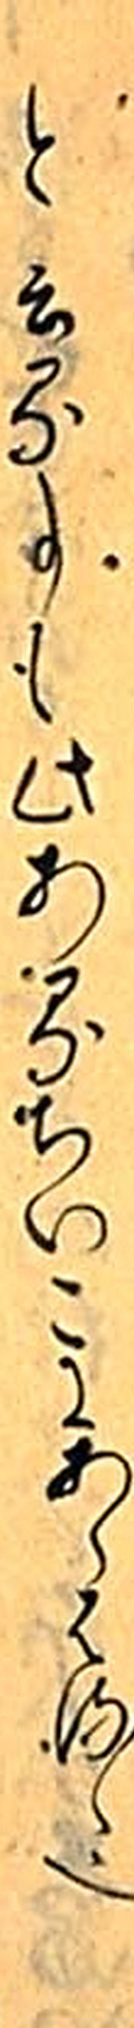と云る事も此あるちいこにあらはるゝ也
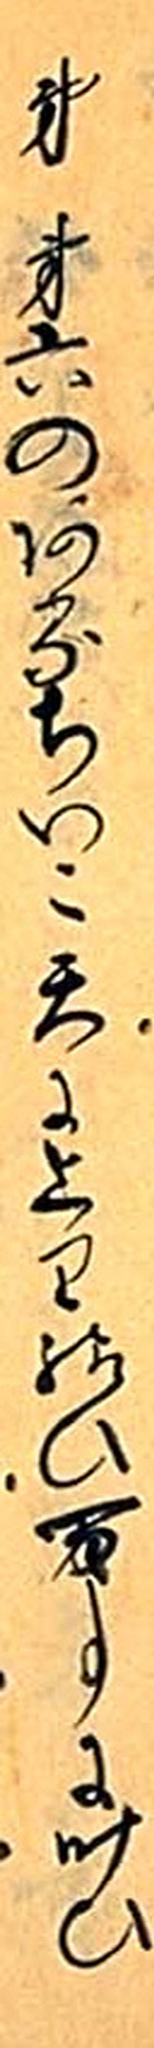弟第六のあるちいこ天に上り給ひ万事に叶ひ
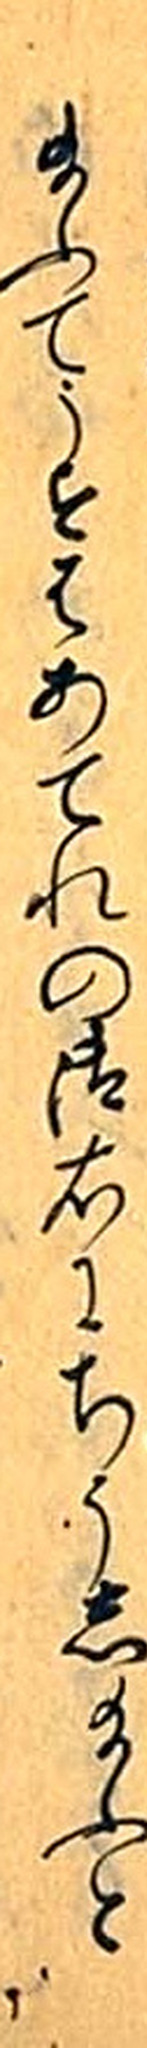給ふてうすはあてれの御右にちうし給ふと
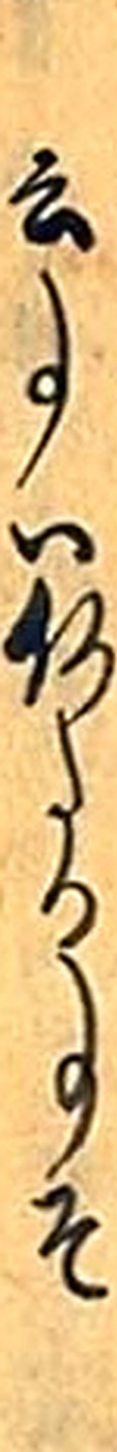云事は何たる事そ
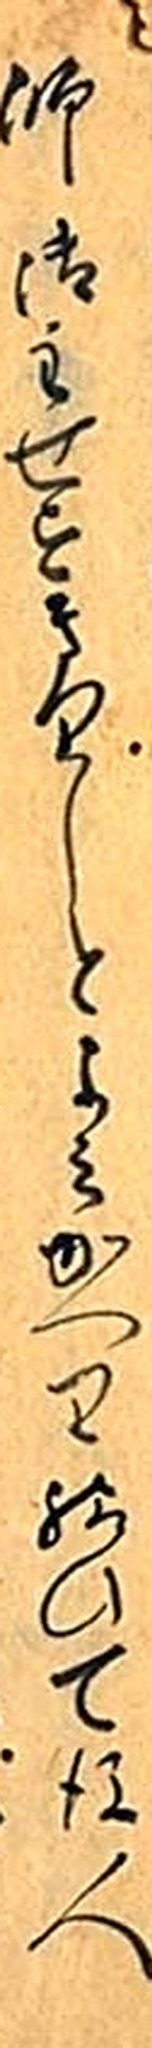師御主せすきりしとよみかへり給ひて後人
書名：ドチリナ・キリシタン
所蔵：東京大学総合図書館 / General Library in the University of Tokyo
